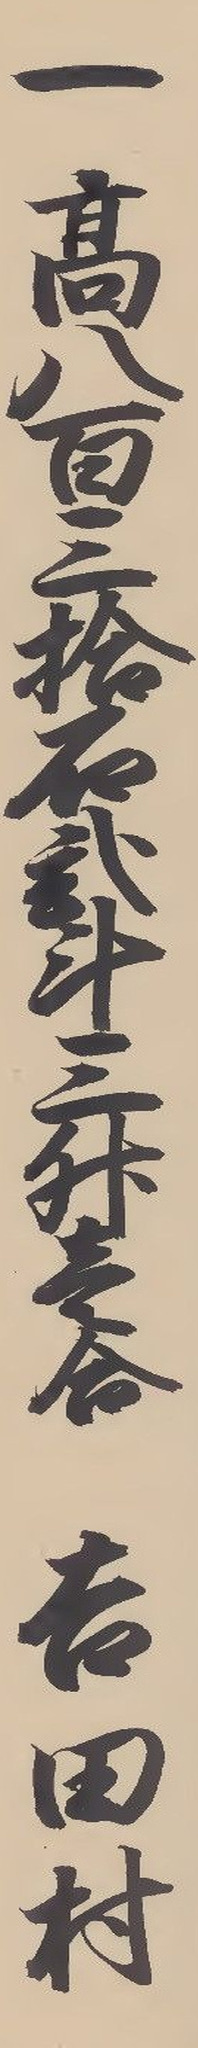一高八百三拾石弐斗三升壱合吉田村
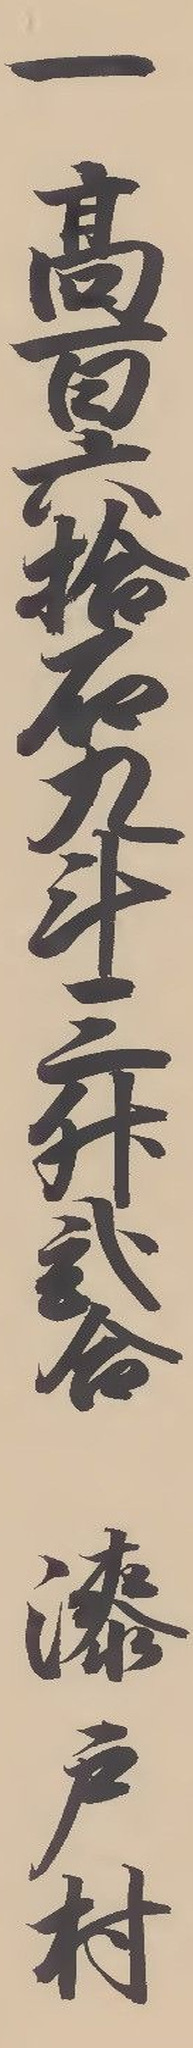一高百六拾石九斗三升弐合漆戸村
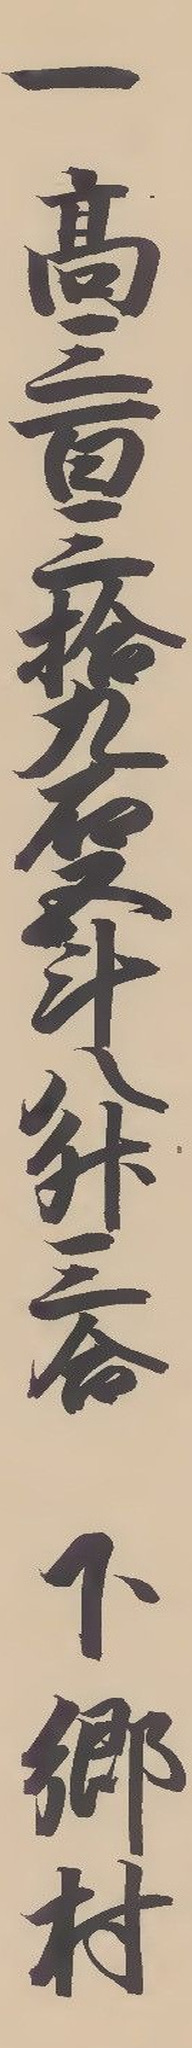一高三百三拾九石五斗八升三合下郷村
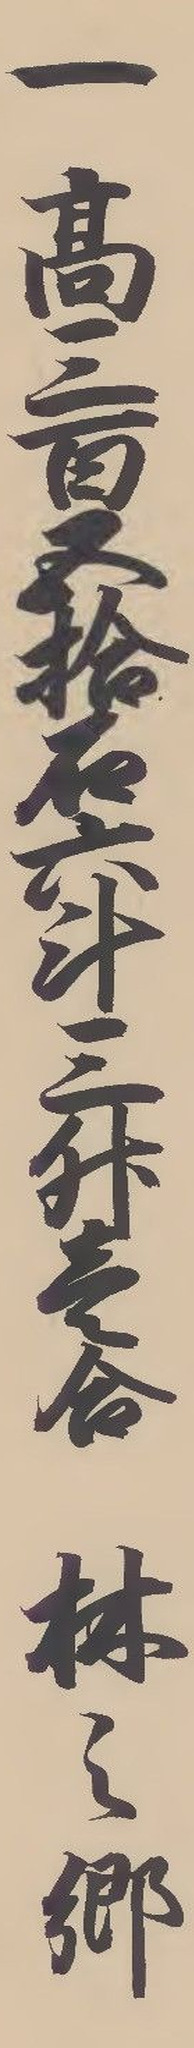一高三百五拾石六斗三升壱合林之郷

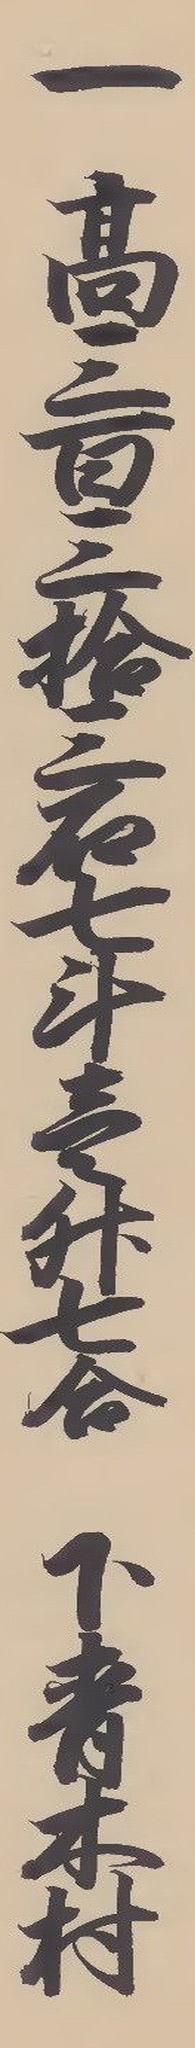一高三百三拾三石七斗壱升七合下青木村
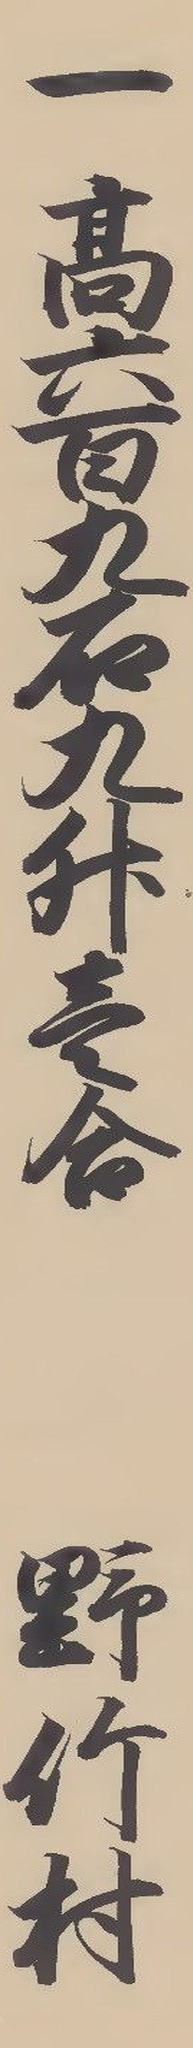一高六百九石九升壱合野竹村
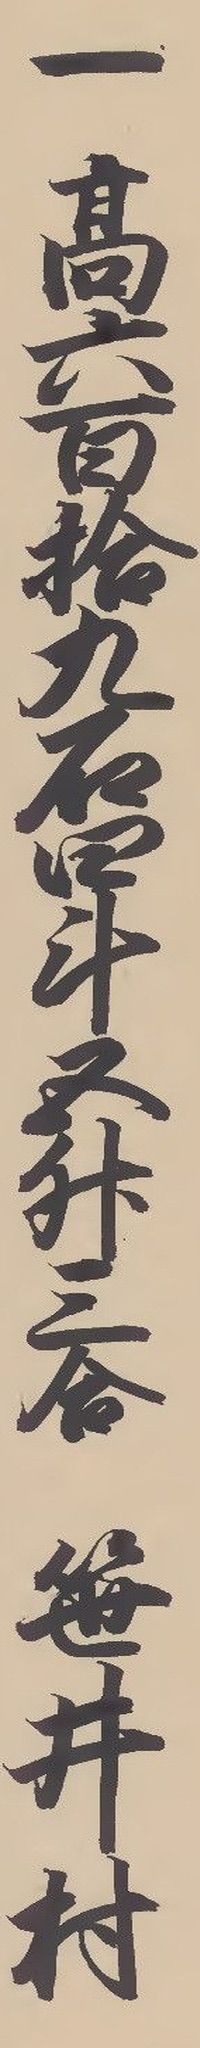一高六百拾九石四斗五升三合笹井村
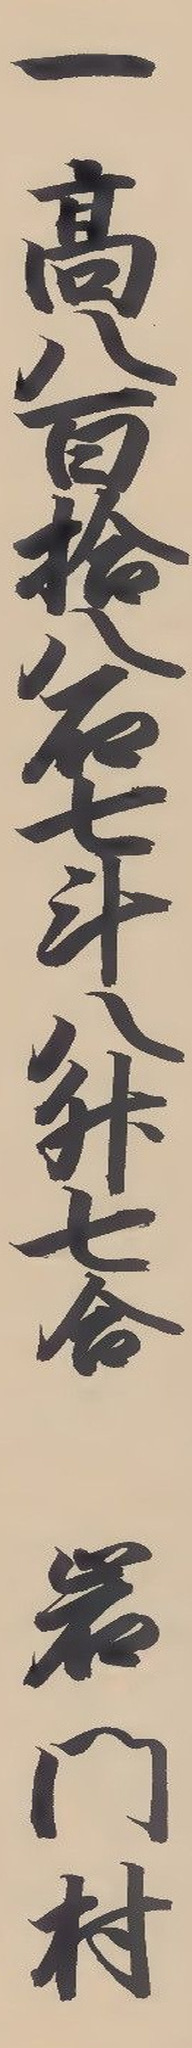一高八百拾八石七斗八升七合岩門村
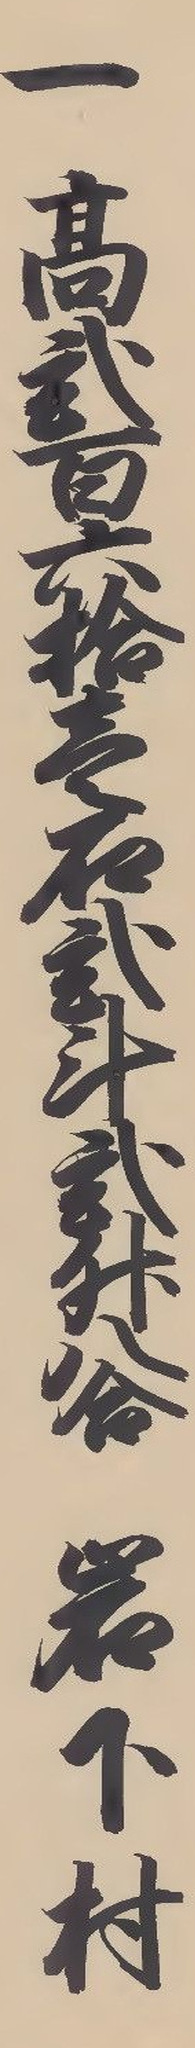一高弐百六拾壱石弐斗弐升八合岩下村
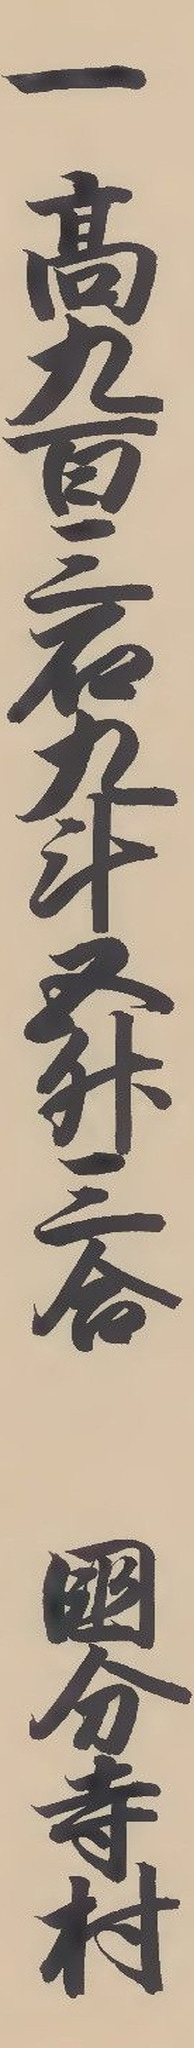一高九百三石九斗五升三合国分寺村
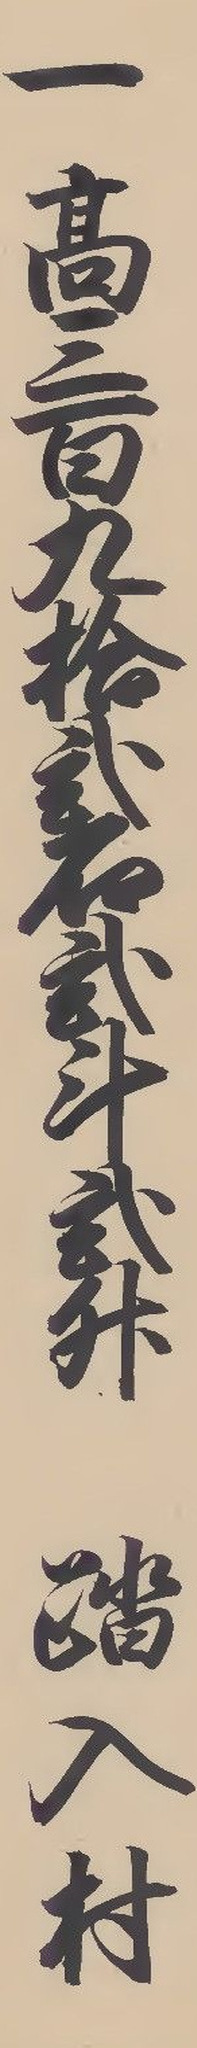一高三百九拾弐石弐斗弐升踏入村

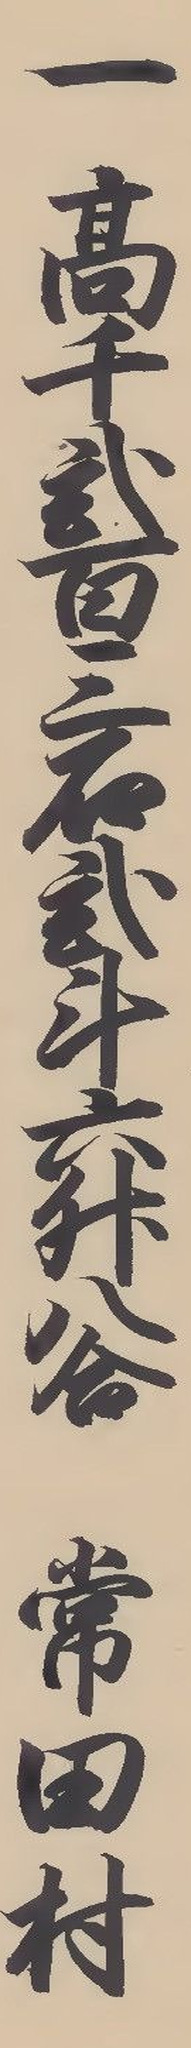一高千弐百三石弐斗六升八合常田村
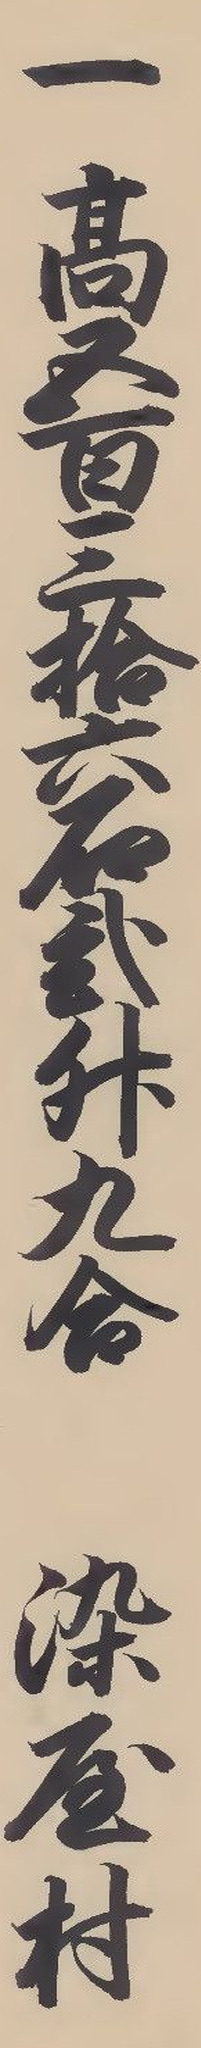一高五百三拾六石弐升九合染屋村
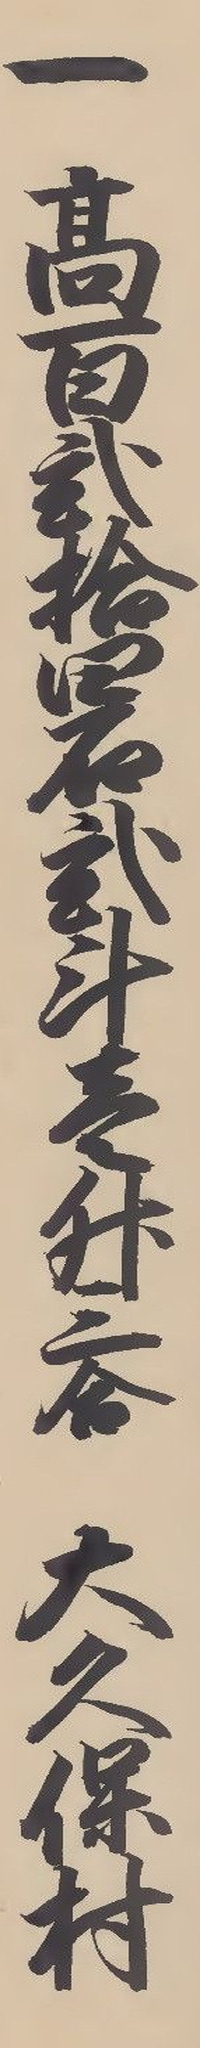一高百弐拾四石弐斗壱升三合大久保村
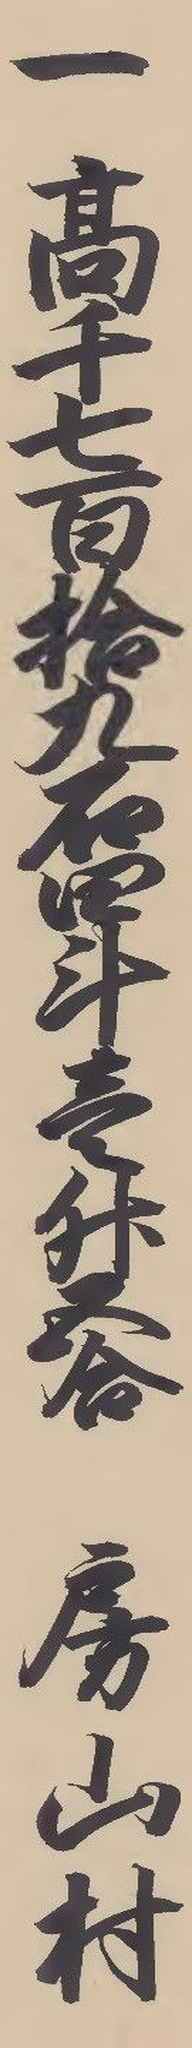一高千七百拾九石四斗壱升五合房山村
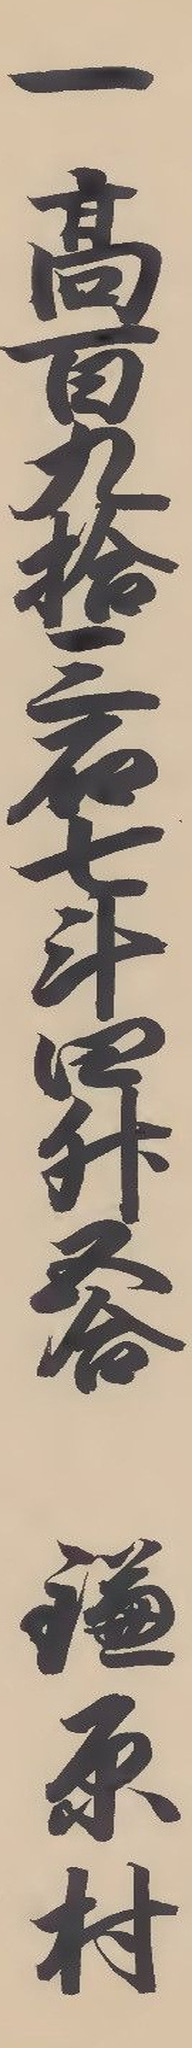一高百九拾三石七斗四升五合鎌原村
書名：信濃国郷帳
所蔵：国立公文書館 National Archives of Japan
